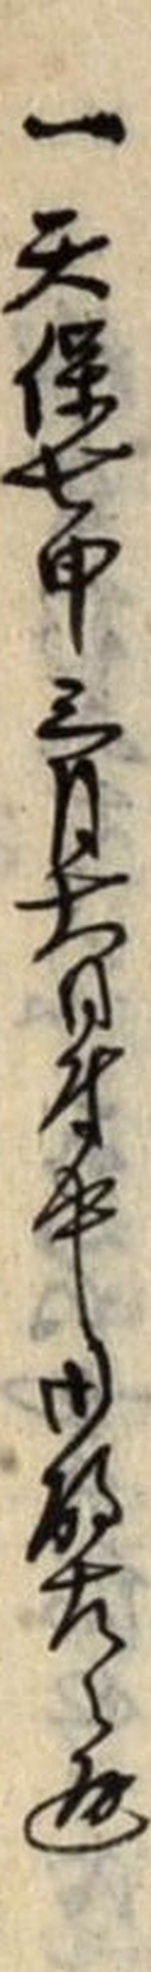一天保七申三月大目付中御触左之通
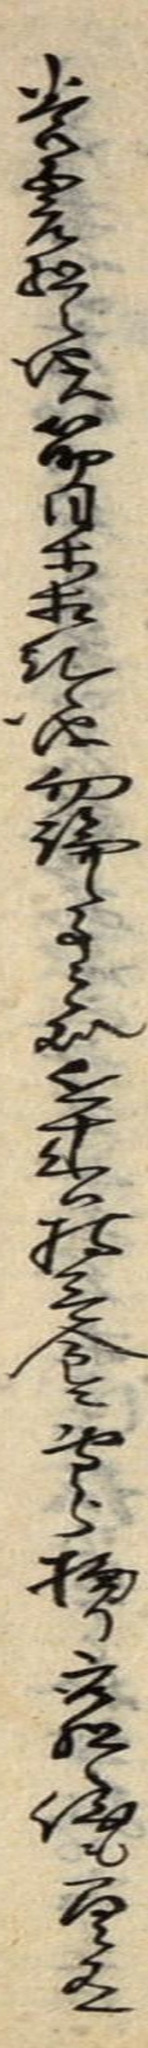養子取組之儀ハ筋目等相糺候儀勿論之事ニ候処近来ハ持参金ニ専ら拘り取組候儀も間々有

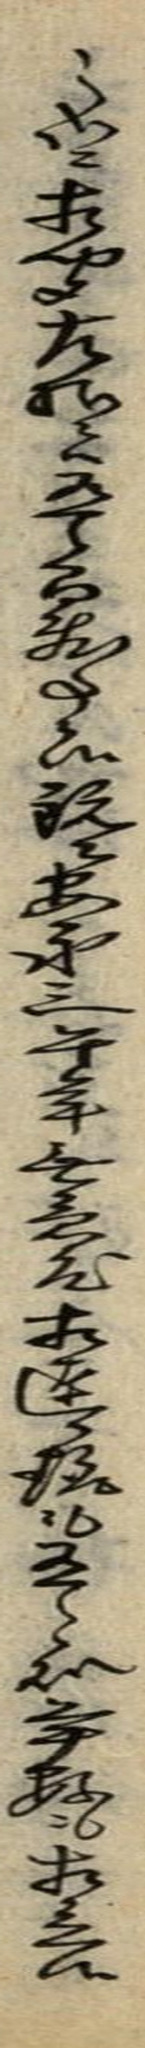之哉ニ相聞左様ニハ有之間敷事ニ候既ニ安永三午年無急度相達候趣も有之候処年数も相立候
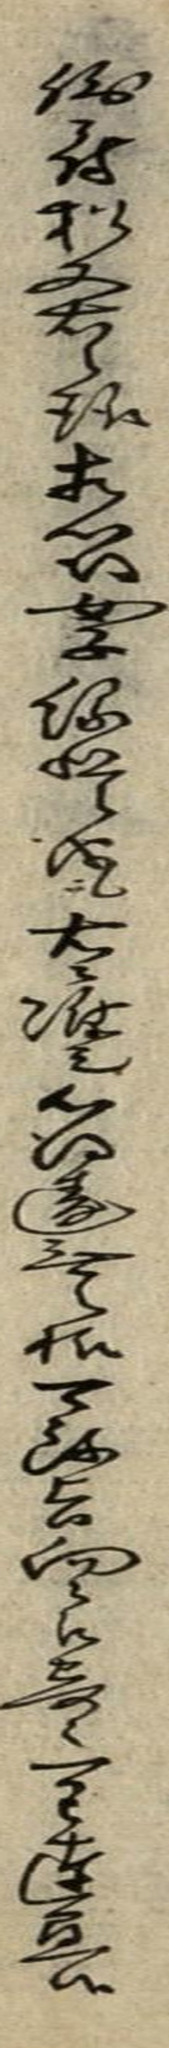儀ニ付猶又右之趣相心得女子縁組之儀も右ニ准シ心得違無之様可致旨向々江寄々可被達置候
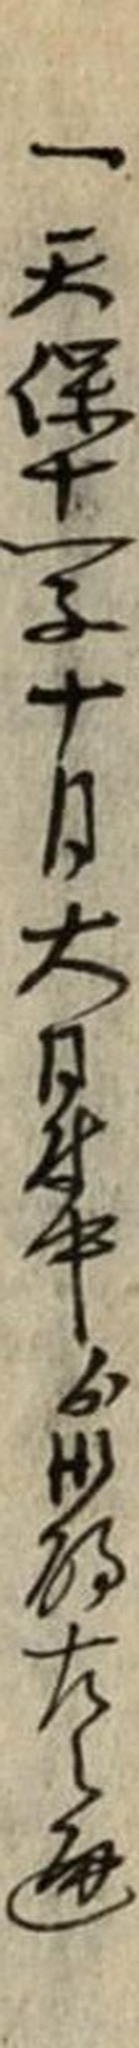一天保十一子十月大目付中ゟ御触左之通
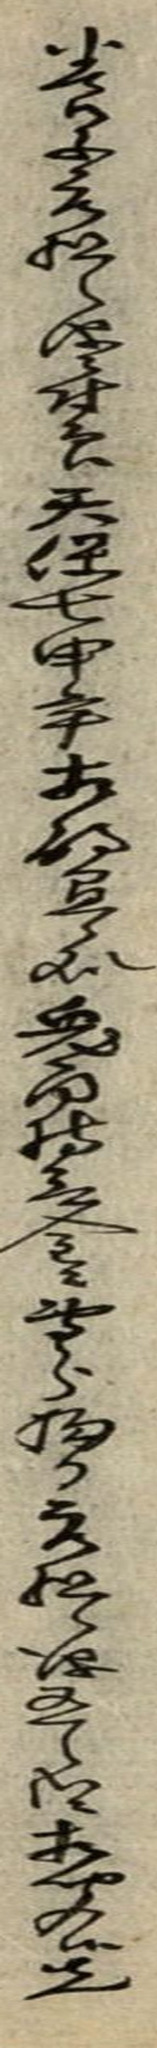養子取組候儀ニ付而ハ天保七申年相触置候処兎角持参金ニ専ら拘り取組候儀有之哉ニ相聞候先
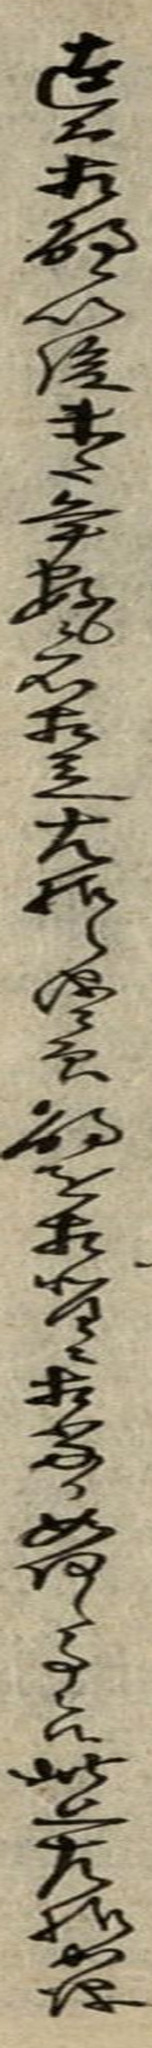達而相触候以後未た年数も不相立左様之儀ニ而ハ触を相背候ニ相当り如何之事ニ候此上左様成儀
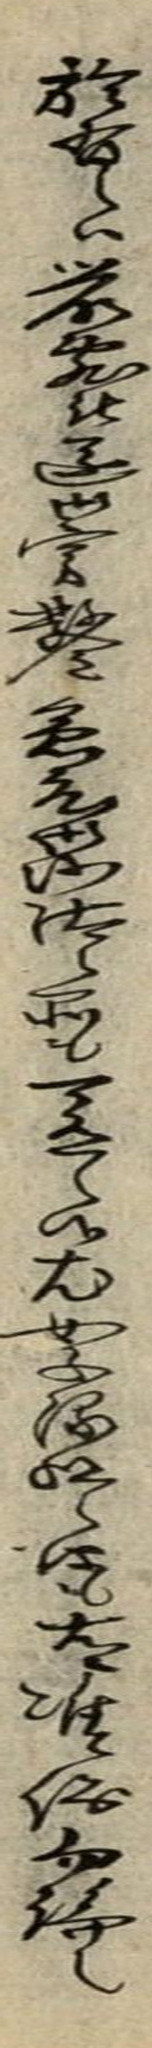於有之ハ厳敷被遂御穿鑿急度御沙汰之品も可有之候尤女子縁組之儀も右ニ准候儀勿論之
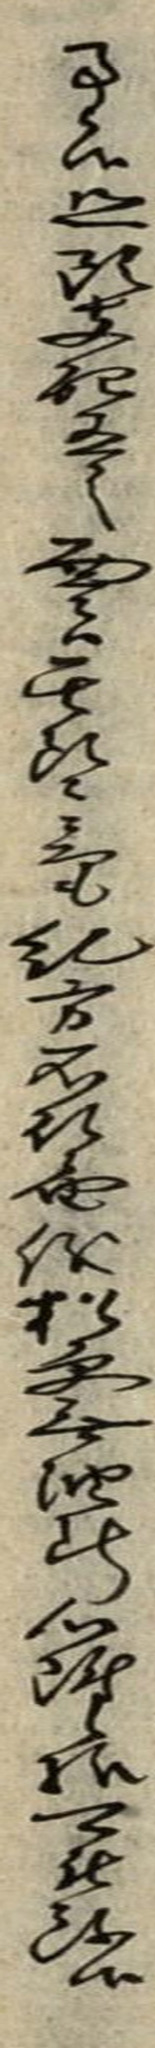事ニ候且頭支配有之面々ハ其頭々ニ而も糺方不行届儀猶更無油断心附候様可被致候
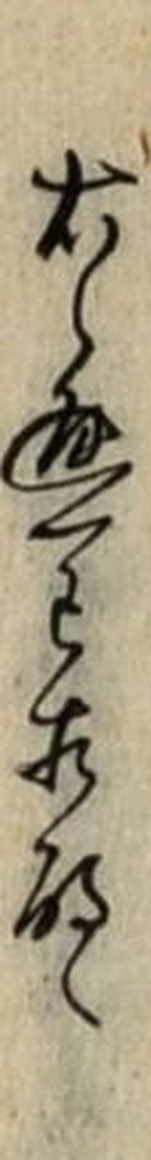右之通可被相触候
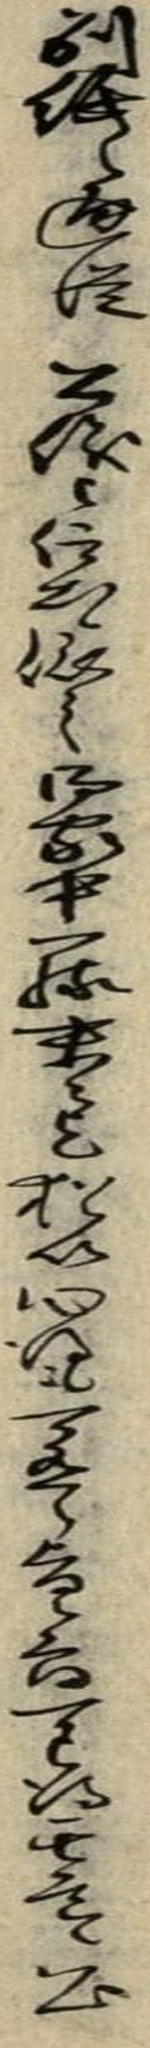別紙之通従公儀被仰出候依之御家中一統末々迄猶以心得も可有之旨ニ候間可被得其意候以上
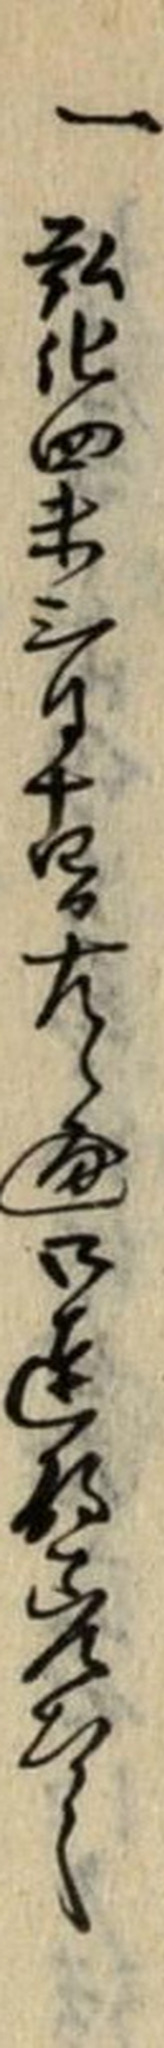一弘化四未三月十四日左之通御口達触差出之
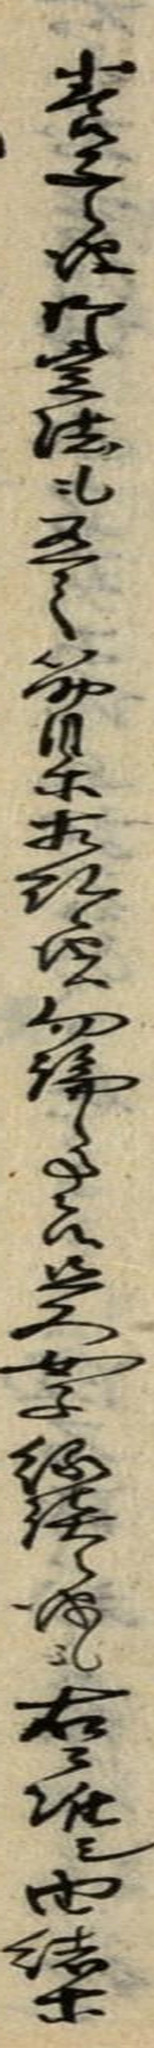養子之儀御御定法も有之筋目等相糺候儀ハ勿論之事ニ候且又女子縁談之儀も右ニ准シ由緒等
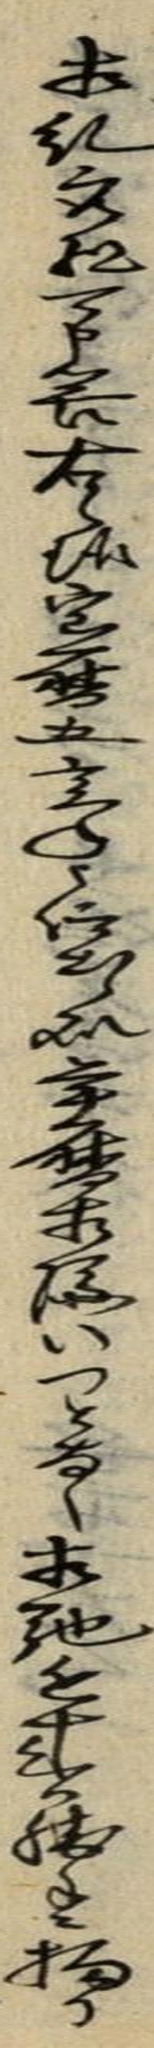相糺取組可申筈右之趣宝暦五亥年被仰出候処年暦相隔いつとなく相弛近来ハ勝手ニ拘り
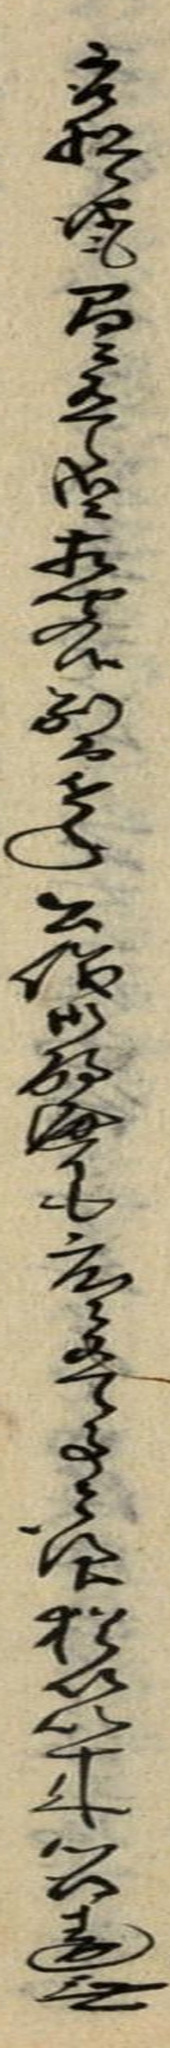取組候儀も間々有之哉ニ相聞候別而近年公儀御触通候も度々有之事ニ候得ハ猶以以来心得違無
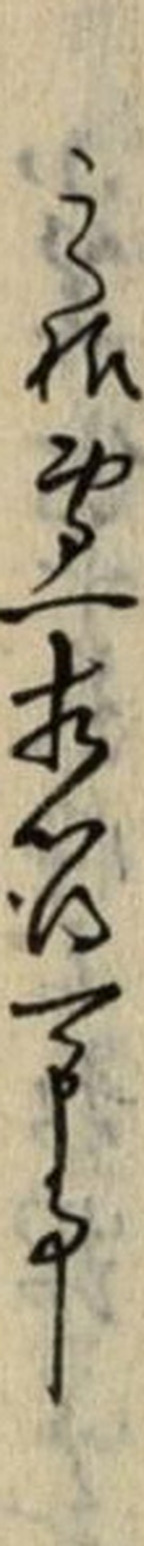之様専一相心得可申事
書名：養子縁組之部
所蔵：福井県文書館 Fukui Prefectural Archives
